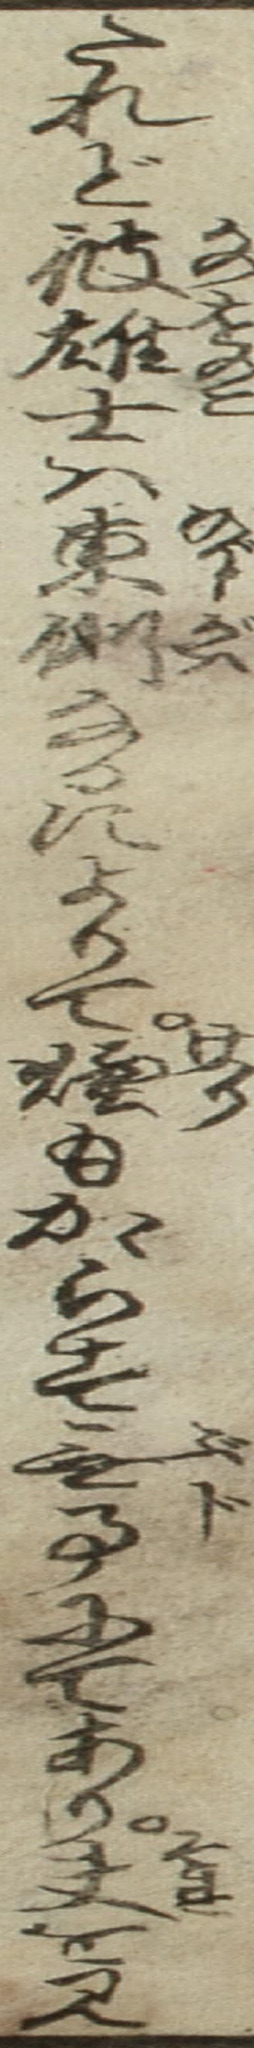たれど彼雄士は東側なるによりて。煙もかゝず無事にてあり。夫を見
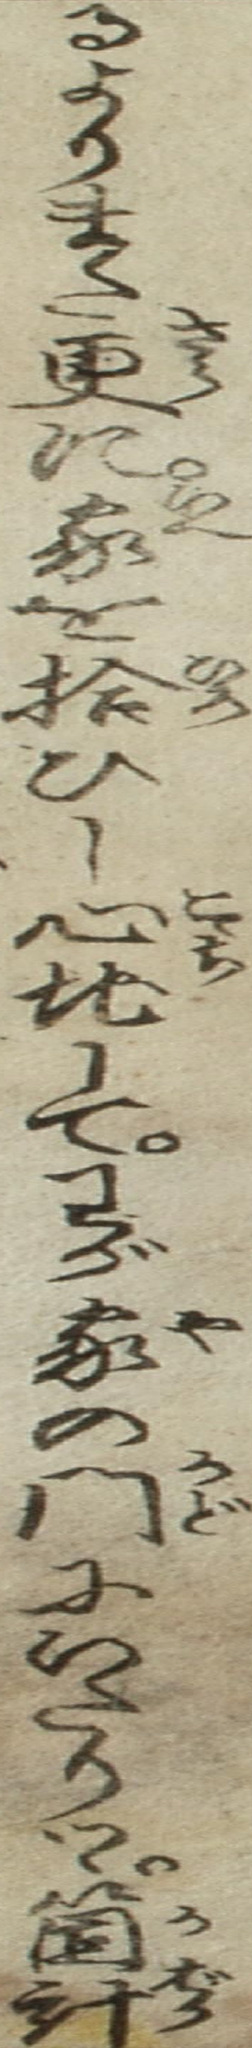るよりまた更に家を拾ひし心地して。わが家の門にいたりつゝ。箇計
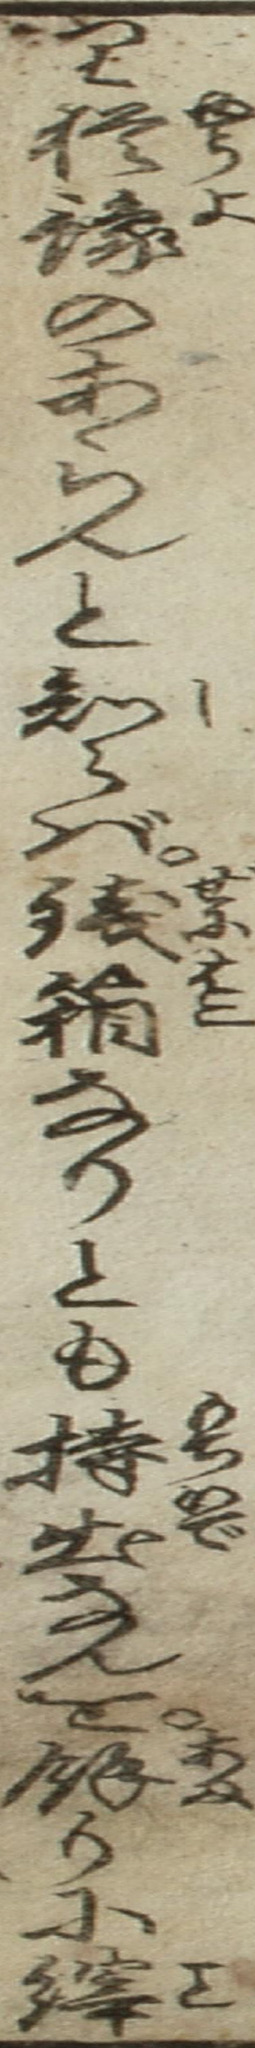り猶予のあらんと知らば。銭箱なりとも持出なんを。餘りに縡
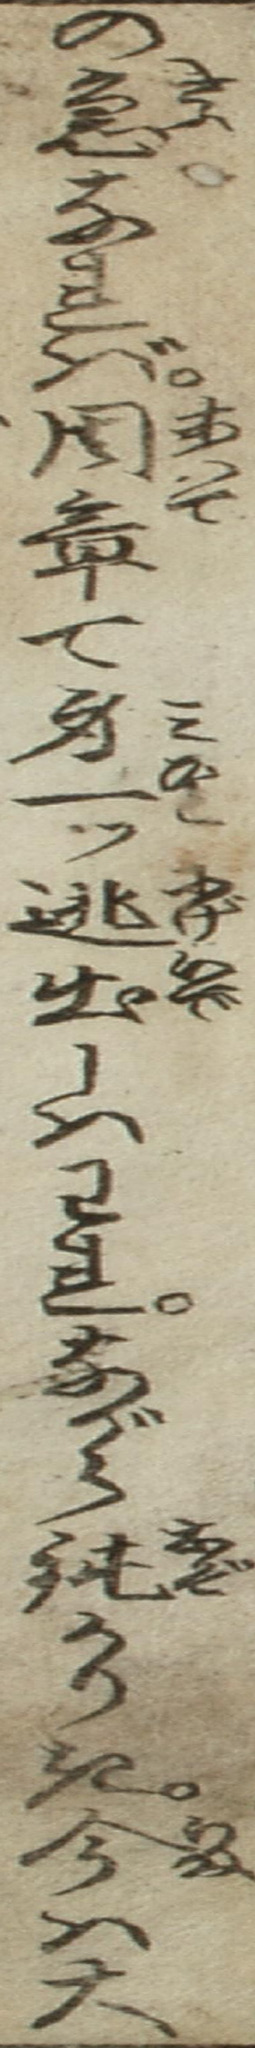の急なれば。周章て身一ッ逃出しはわれ。ながら鈍かりき。今は大
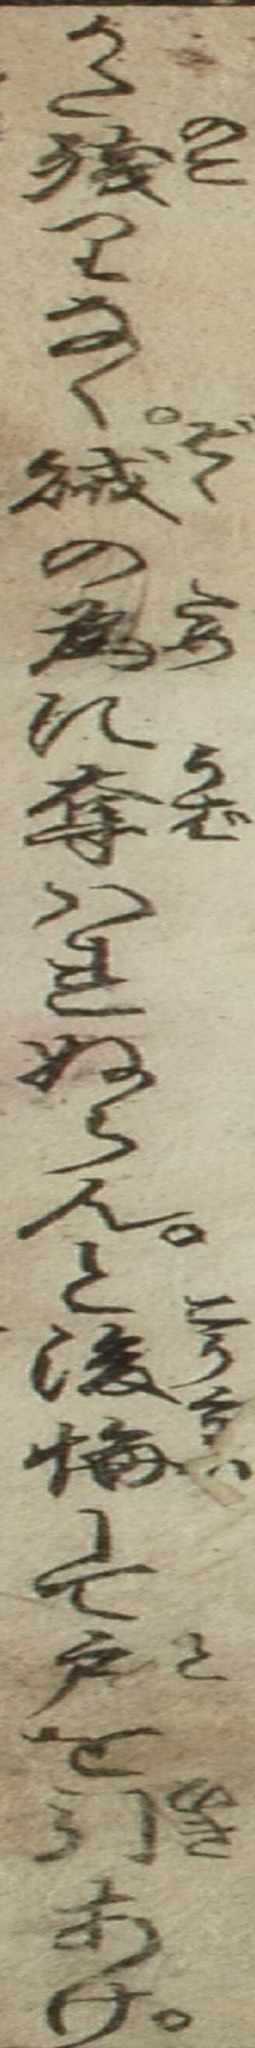かた残りなく。賊の為に奪はれぬらん。と後悔して戸を引あけ。
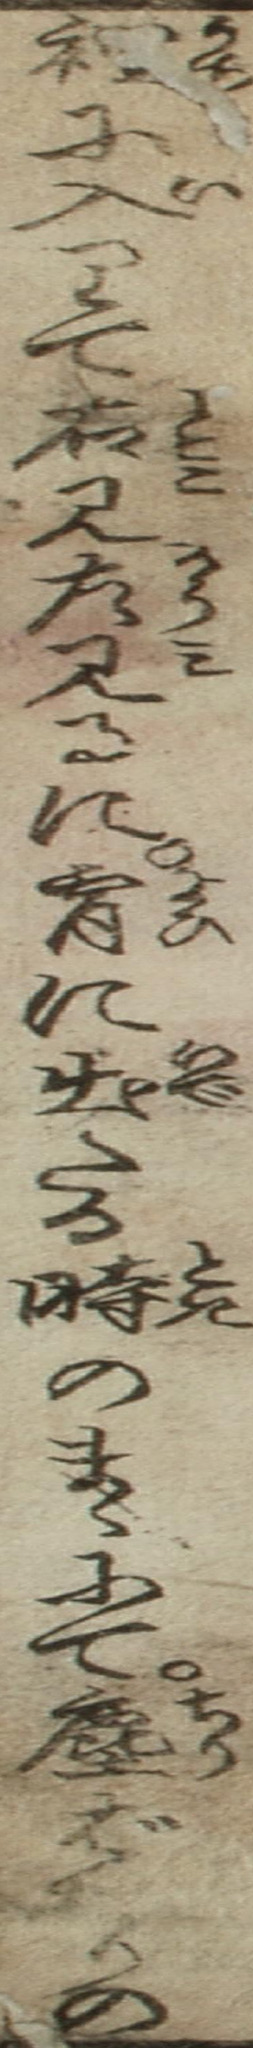裡に入りて右見左見るに。宵に出たる時のまゝにて。塵ばかりの

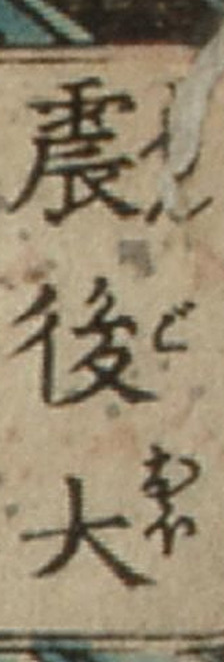震後大
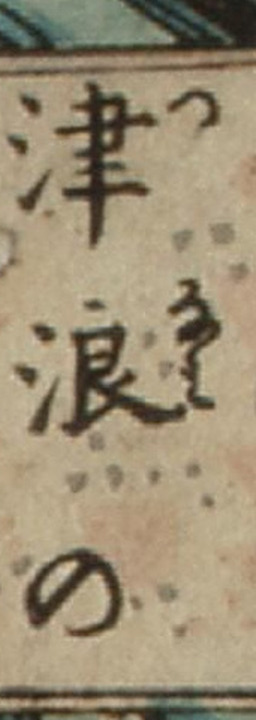津浪の

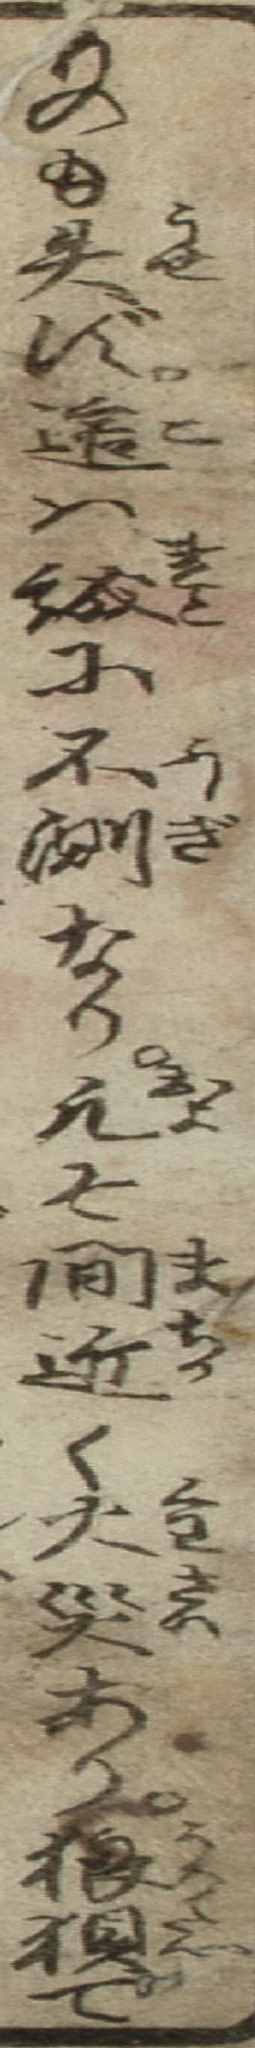ものも失ず。這は誠に不測なり。凡そ間近く火災あり。狼狽て
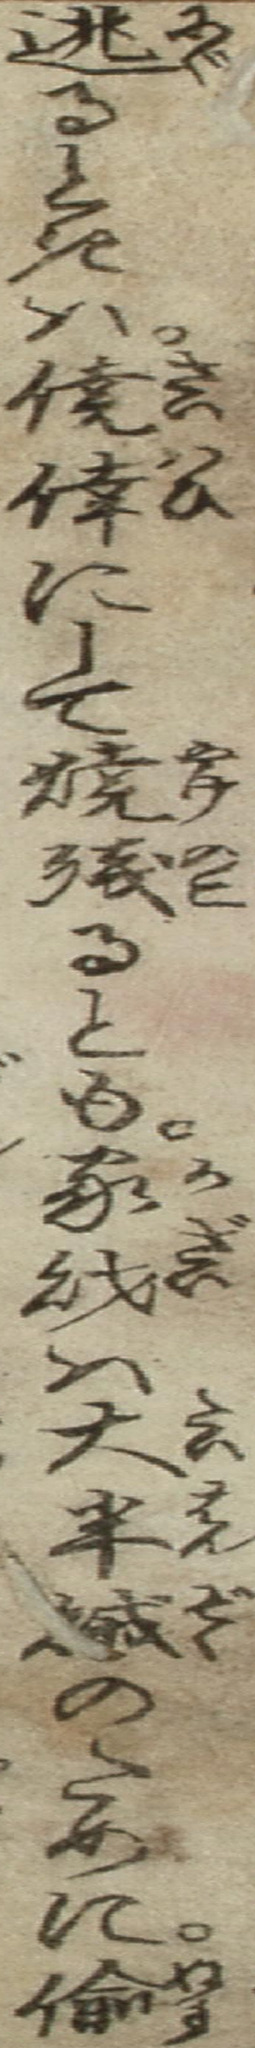逃るときは。僥倖にして焼残るとも。家財は大半賊のために。偸
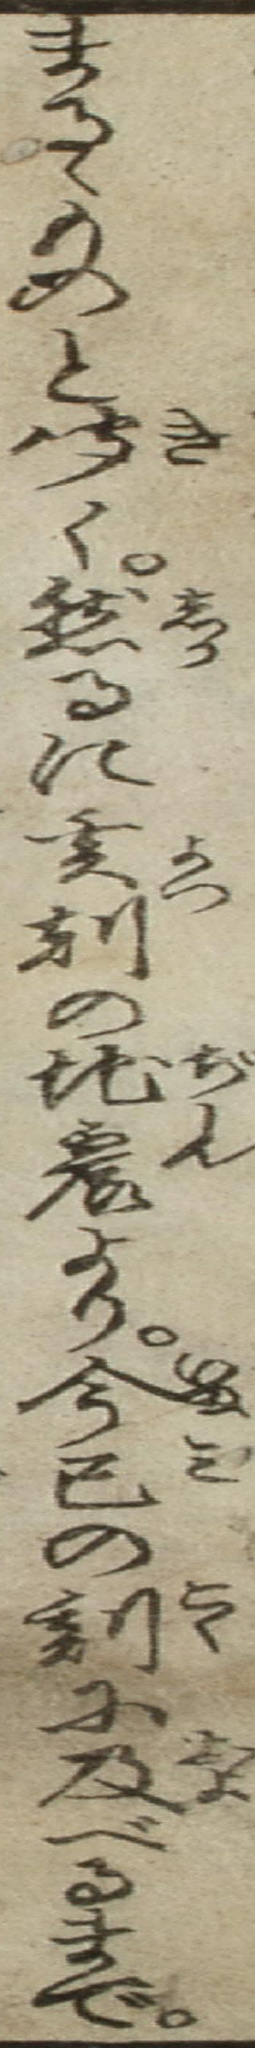まるゝものと聞く。然るに亥刻の地震より。今巳の刻に及べるまで。
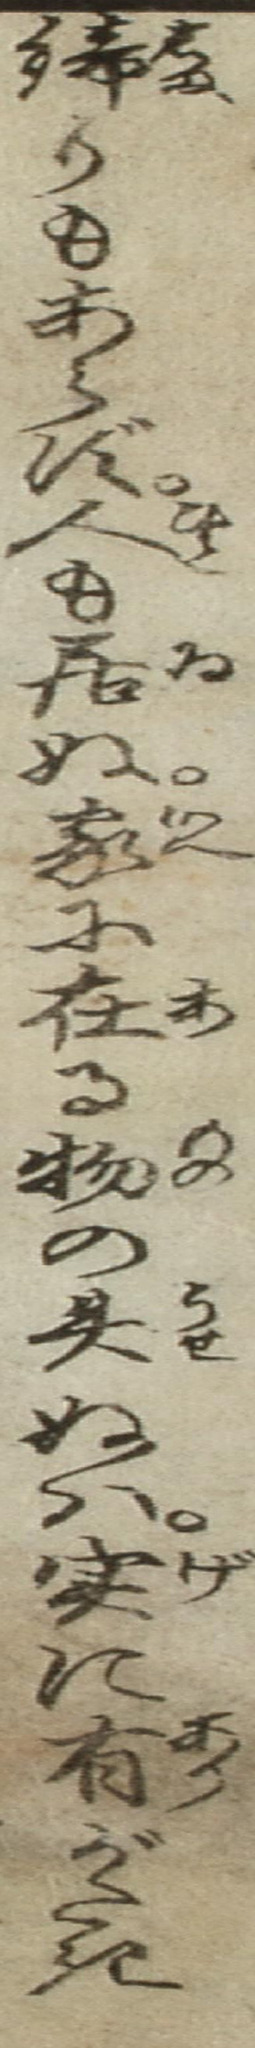締りもあらず。人も居ぬ。家に在る物の失ぬは。実に有がたき
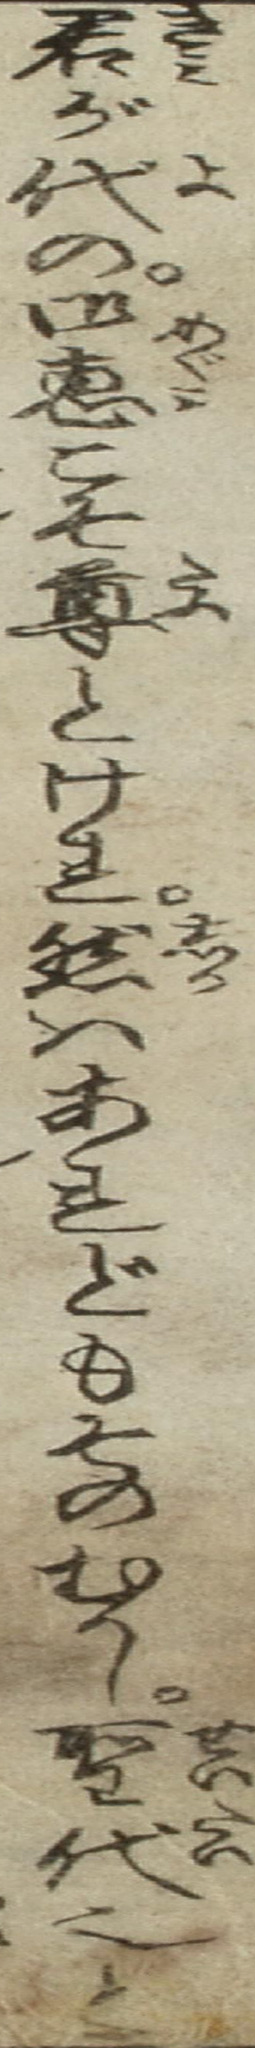君が代の。御恵こそ尊とけれ。然はあれどもそのむかし。聖代也と
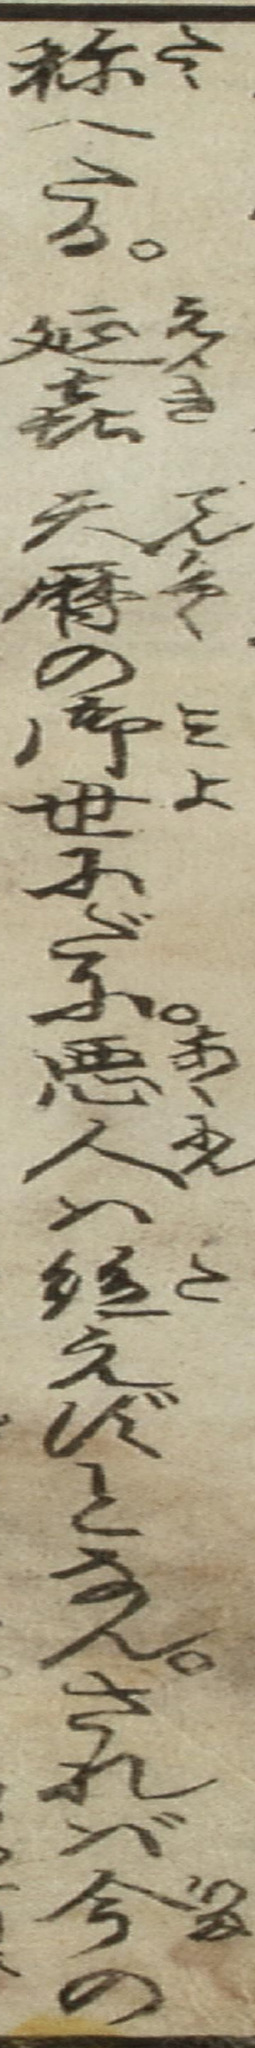称へたる。延喜天暦の御世にだに。悪人は絶えずとなん。されば今の
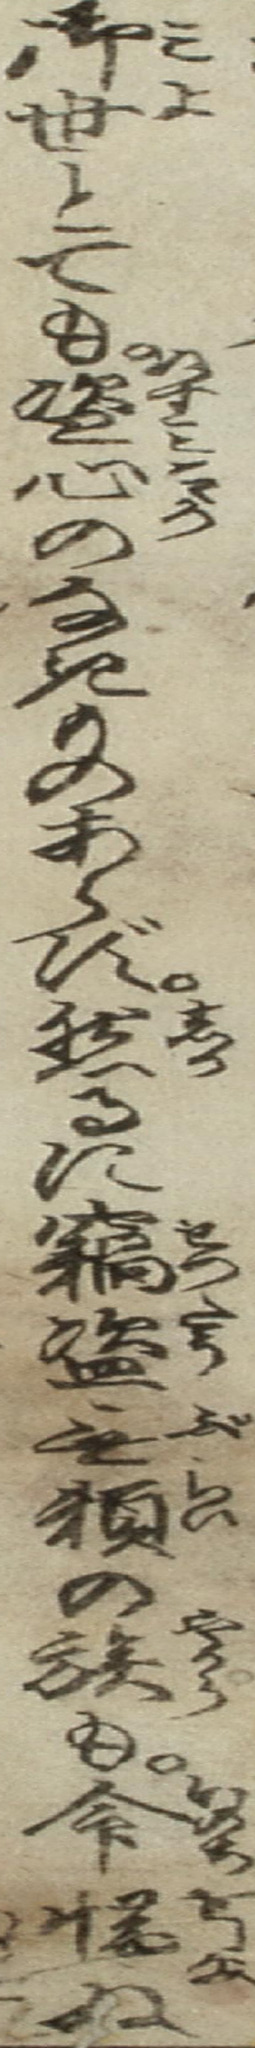御世とても。盗心のなきものあらず。然るに竊盗無頼の族も。命惜？ぬ
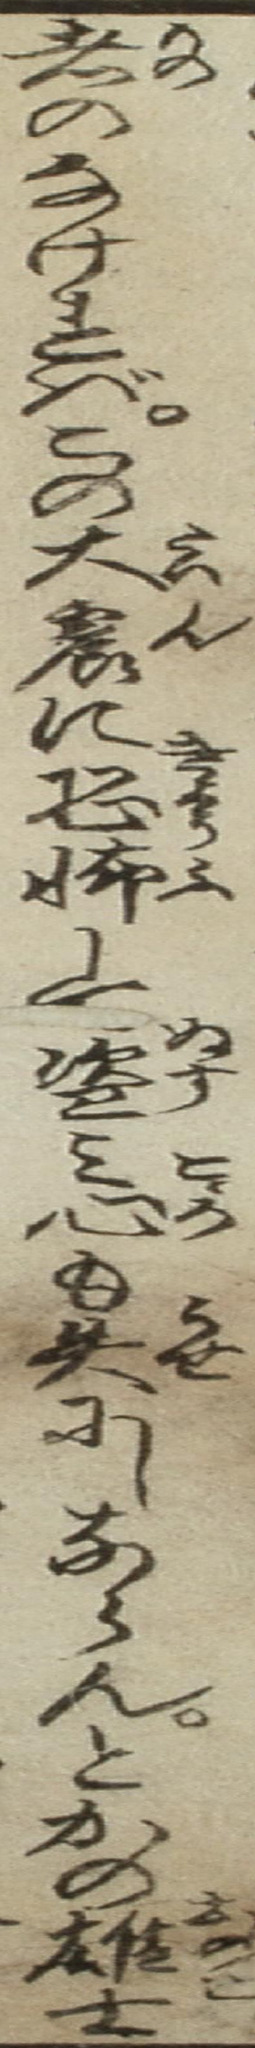者のなければ。この大震に恐怖して。盗み心も失にしならん。とかの雄士
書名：安政見聞録　中
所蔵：東京大学地震研究所図書室 Earthquake Research Institute Library, The University of Tokyo, JAPAN
